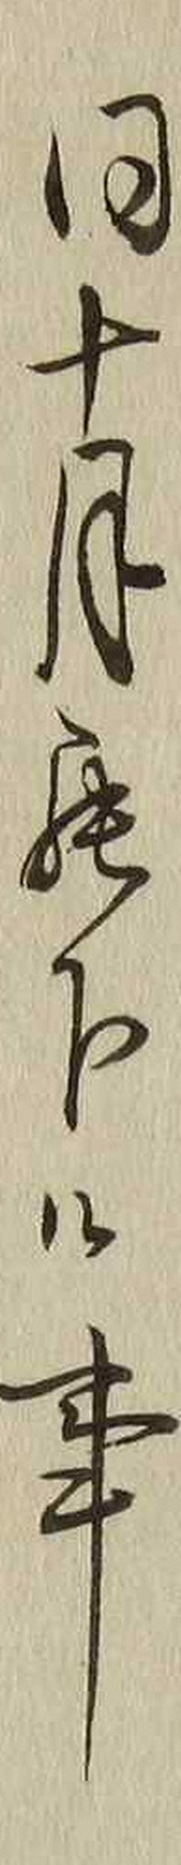同十月罷下候事
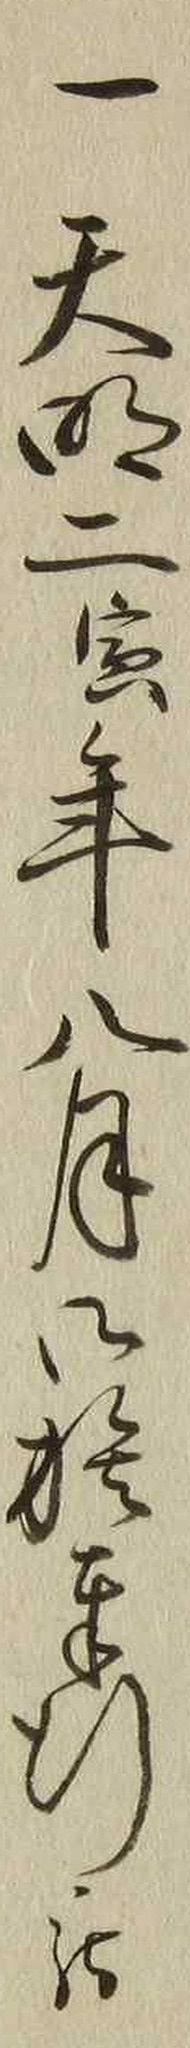一天明二寅年八月御旗奉行被
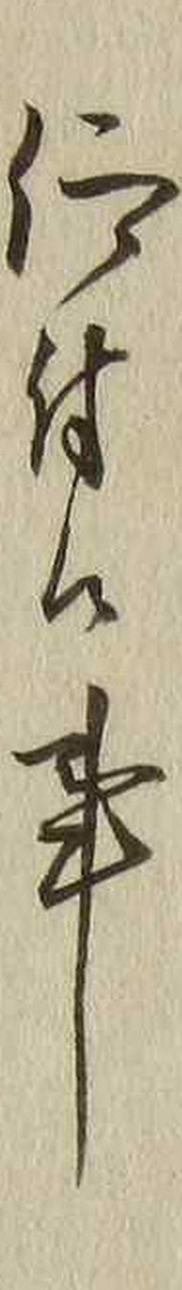仰付候事
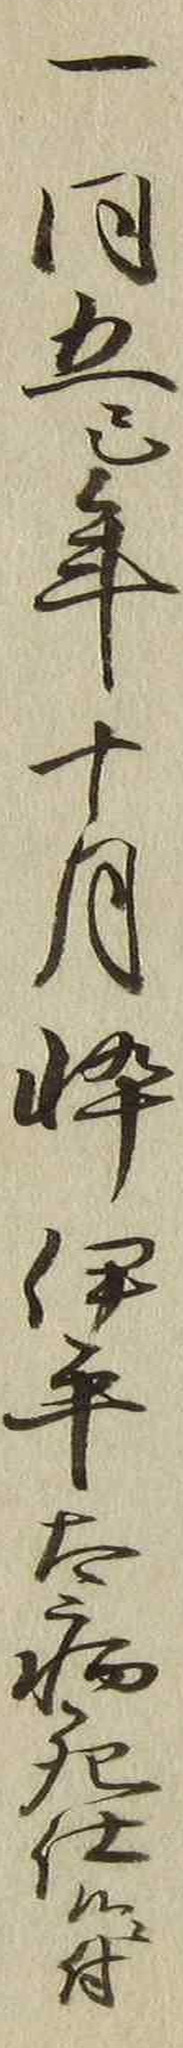一同五巳年十月忰伊平太病死仕候ニ付
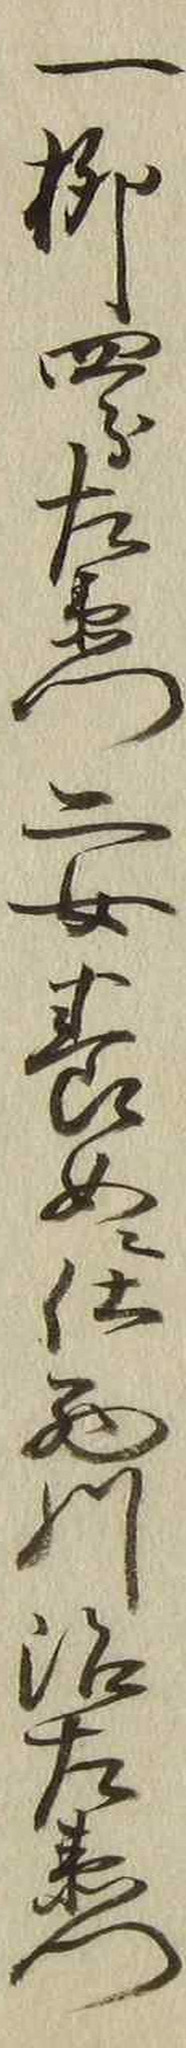一柳四郎左衛門二女養女ニ仕西川治左衛門
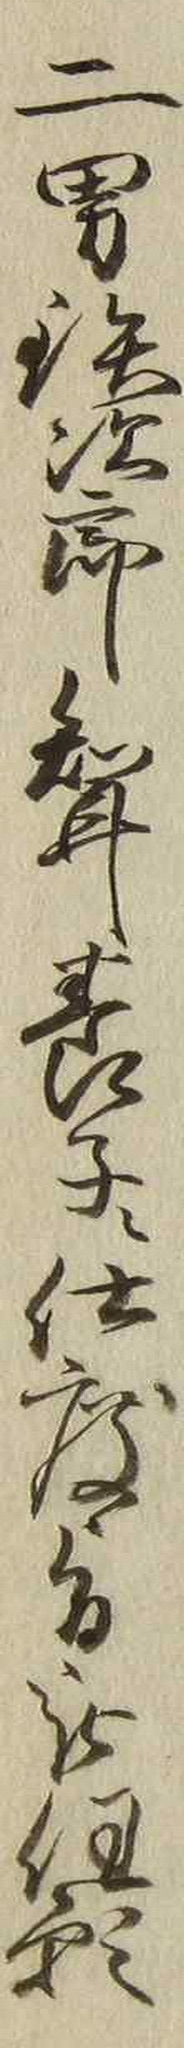二男鉄次郎婿養子ニ仕度旨被任願
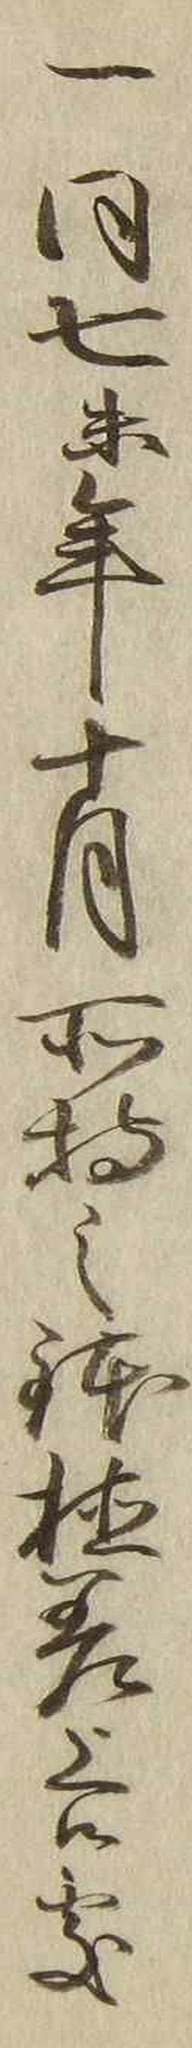一同七未年十月所持之鉢植差上候処

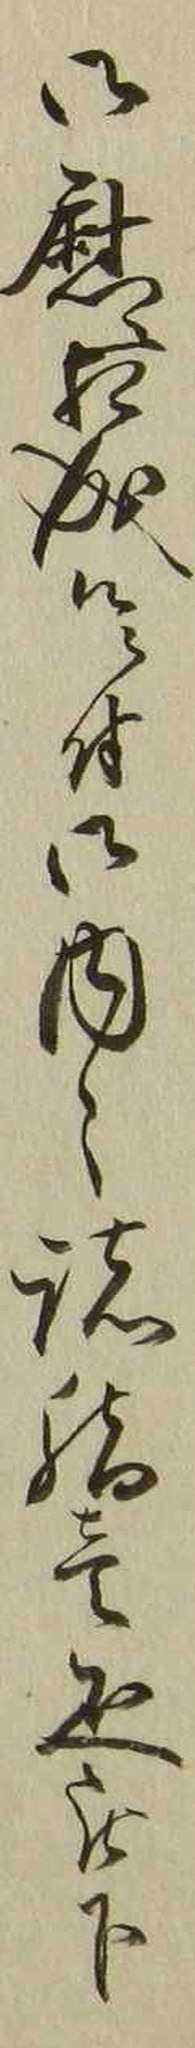御慰ニ相成候ニ付御内々諸絹壱疋被下
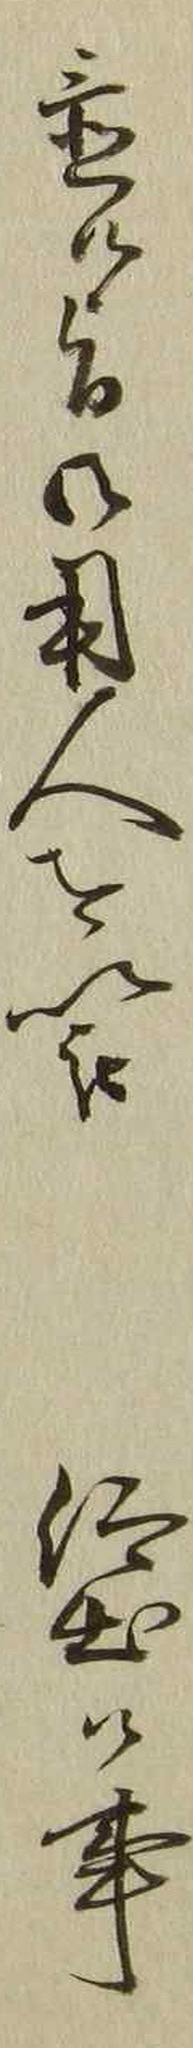置候旨御用人を以被仰出候事
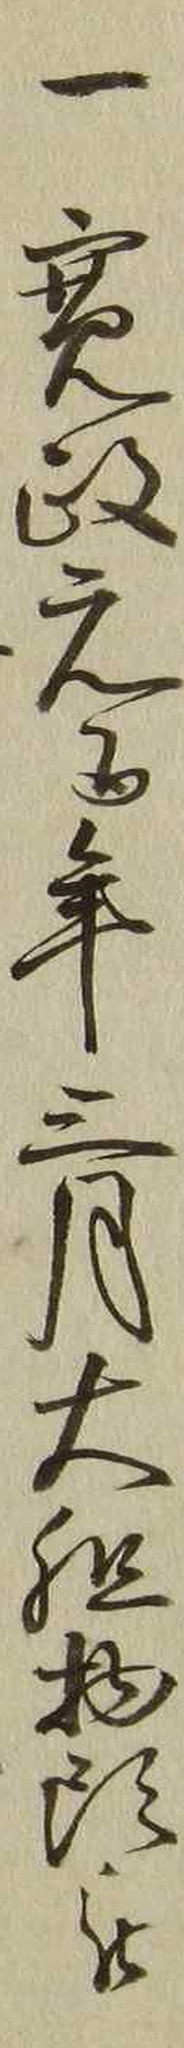一寛政元酉年三月大組物頭被
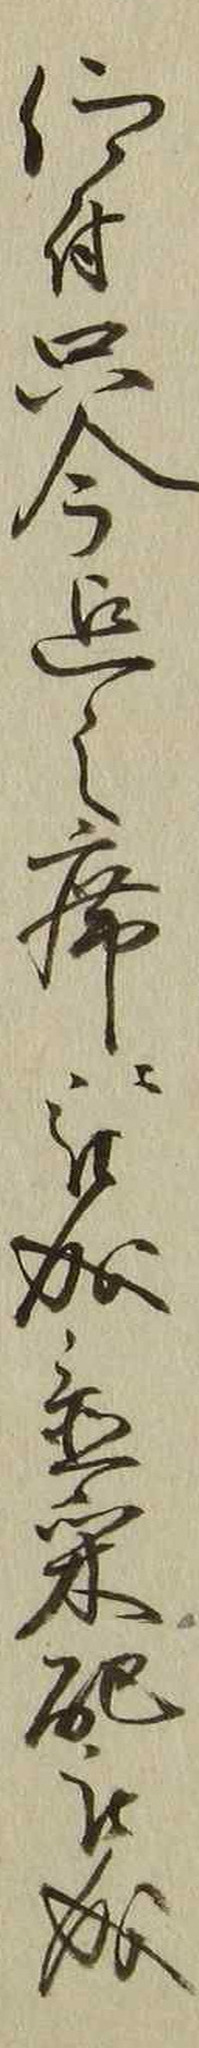仰付只今迄之席ニ被成置采配被成
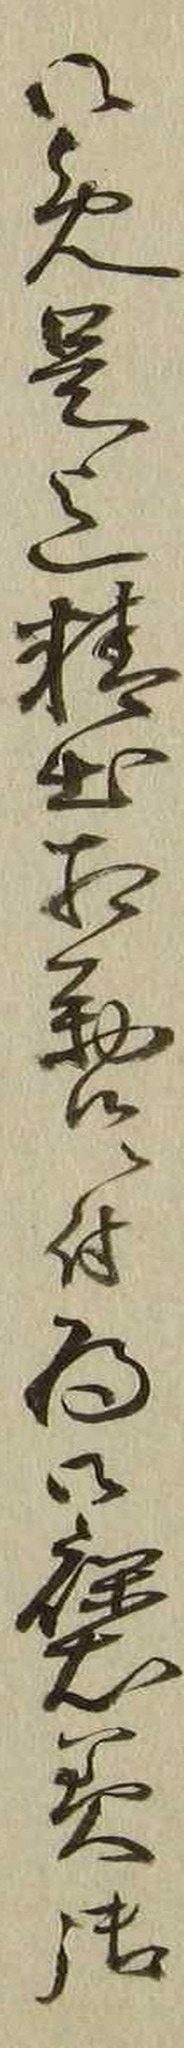御免是迄精出相勤候ニ付為御褒美御
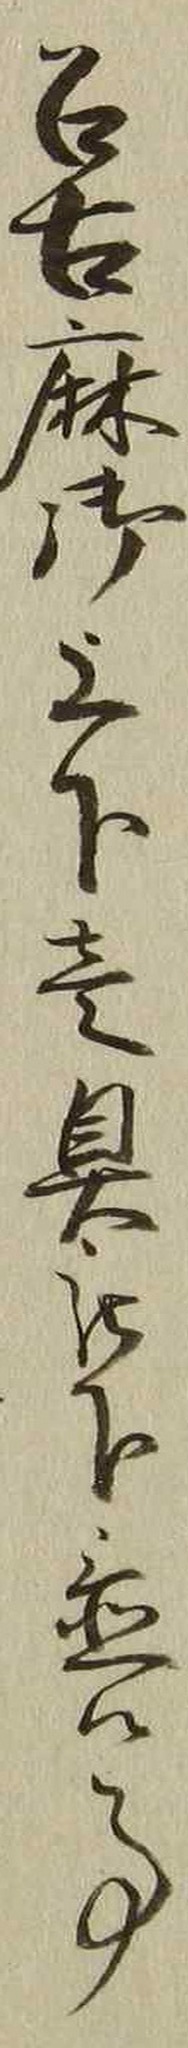召古麻御上下壱具被下置候事
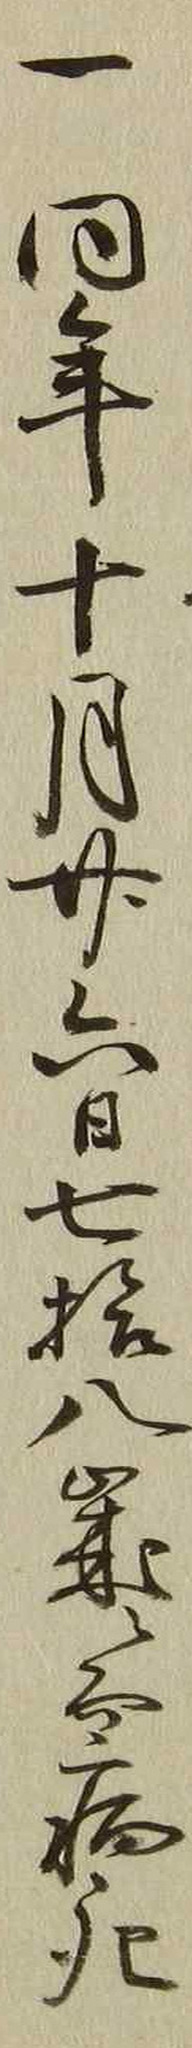一同年十月廿六日七拾八歳ニ而病死
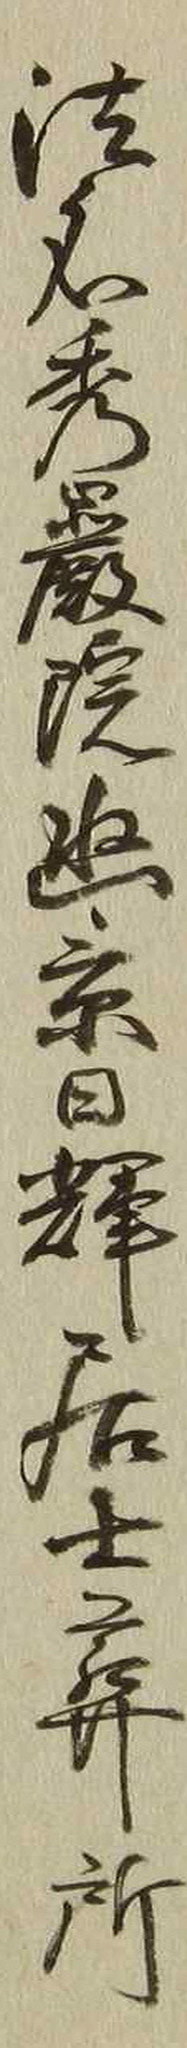法名秀厳院幽景日輝居士葬所
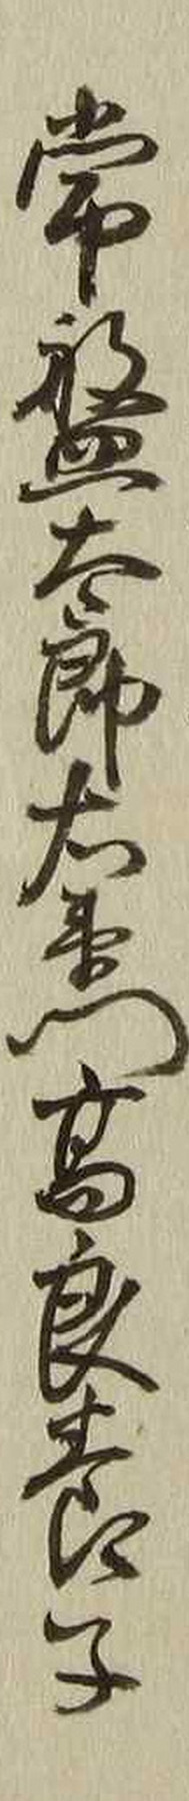常盛太郎右衛門高良養子
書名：諸士系譜　巻之60　と之部3
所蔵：会津若松市立会津図書館
